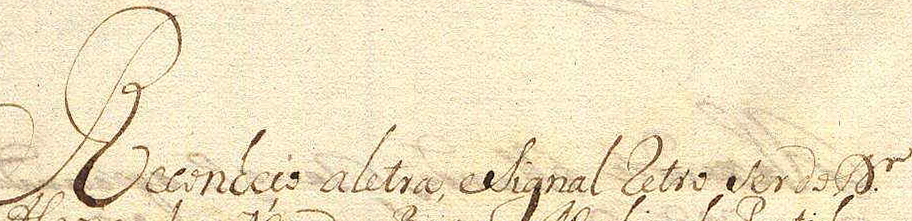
Reconheço a letra, e Signal Retro ser do D.r
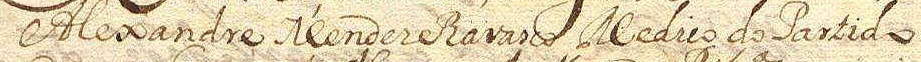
Alexandre Mendez Ravasco Medico do Partido
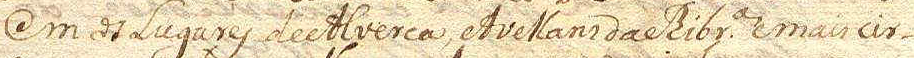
Em os Lugares de Alverca, Avellans da Ribr.a e mais cir
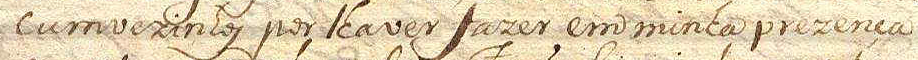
cumvezinhos por lha ver fazer em minha prezença
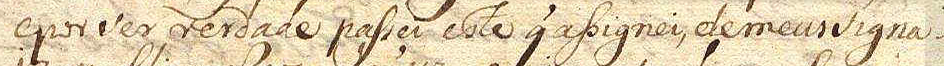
e por ser verdade passei este q̄ assignei, de meus signa
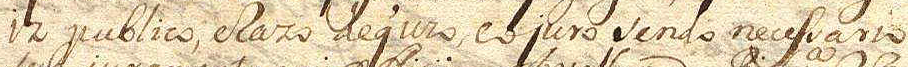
iz publico, e Razo de q̄ uzo, e o juro sendo necessario
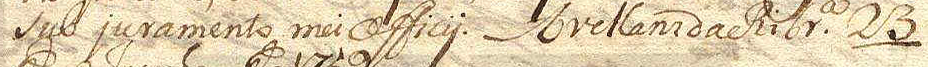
sub juramento mei Officis. Avellans da Ribr.a 23
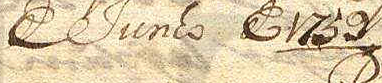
E Iunho d̄ 1759
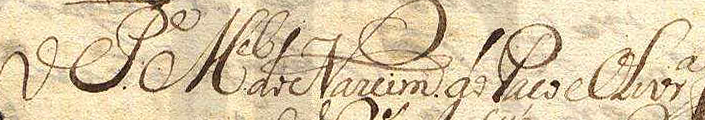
O P.e M.el do Nascim.to do Paço e Olivra
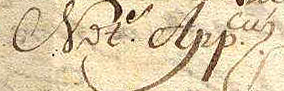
Not.s App.cus
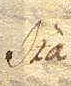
Ità
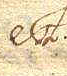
est.
